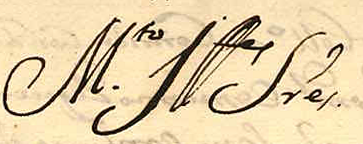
M.to Jlles Srēs.
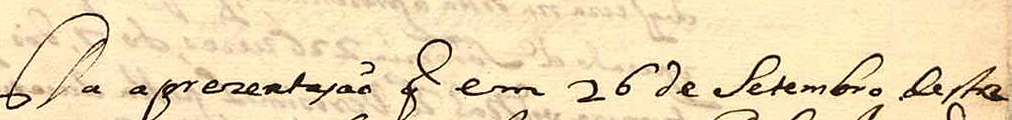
Da aprezentasaõ q̄ em 26 de Setembro deste
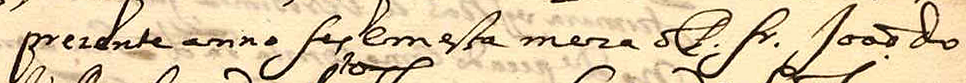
prezente anno fes em esta meza o P. fr. Joaõ do
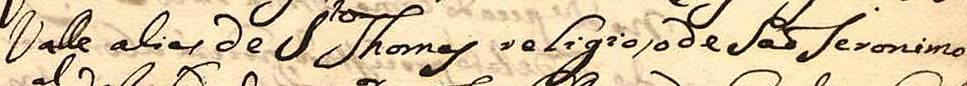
Valle alias de Sto Thomas religioso de Saõ Ieronimo
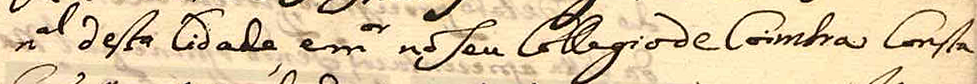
nal desta Cidade, e mor no Seu Collegio de Coimbra Consta
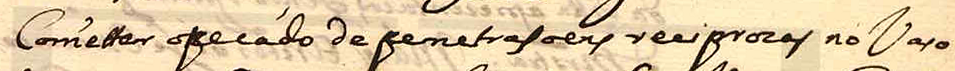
Com̄etter o pecado de penetrasoens reciprocas no Vaso
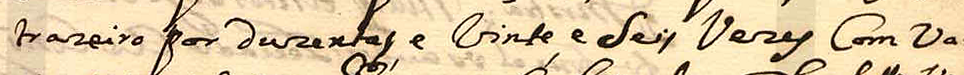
trazeiro por duzentas, e Vinte, e Seis Vezes Com va
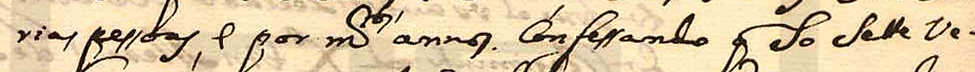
rias pessoas, e por mtos annos. confessando q̄ So Sette ve
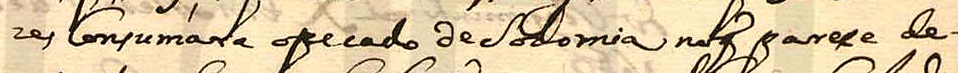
zes Consumara o pecado de Sodomia no q̄ parece de
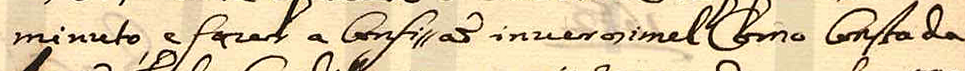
minuto, e fazer a Confissaõ inuerosimel Como Consta da
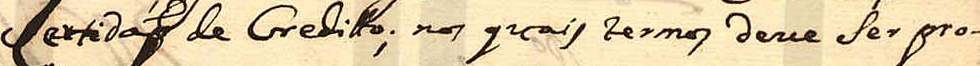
Certidaõ de Creditto; nos quais termos deue ser pro
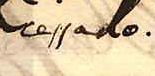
cessado.
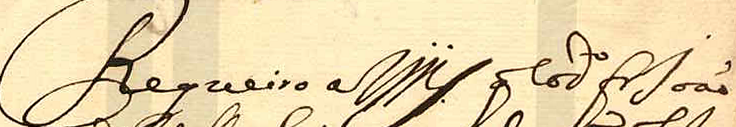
Requeiro a V M̄s. q̄ ho do fr Ioaõ
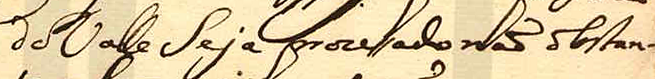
do Valle Seja processado naõ obstan
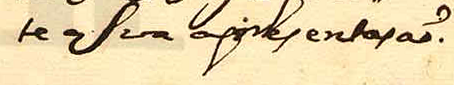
te a Sua apresentasaõ.
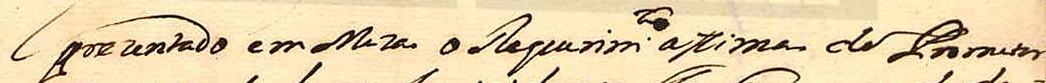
E prezentado em Meza o Requerim.to assima do Prometor
